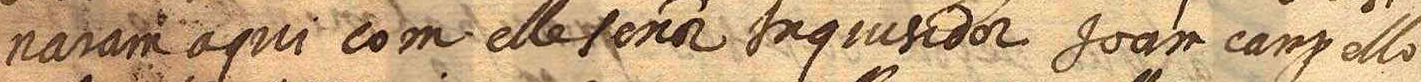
naram aqui com elle sen̄or Inquisidor Joam campello
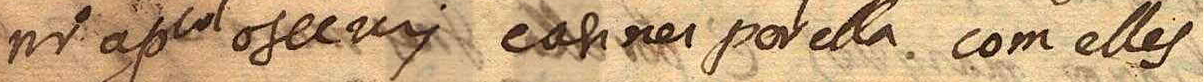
nro apco o sceuy e asinei por ella com elles
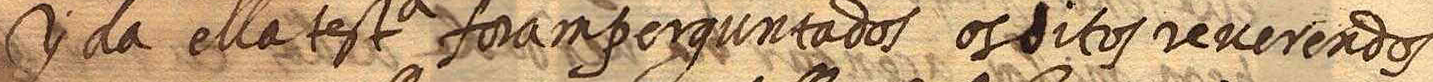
Yda ella testa foram perguntados os ditos reuerendos
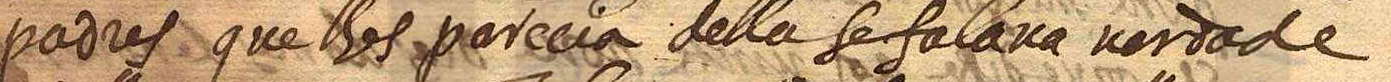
padres que lhes parecia della se falaua uerdade
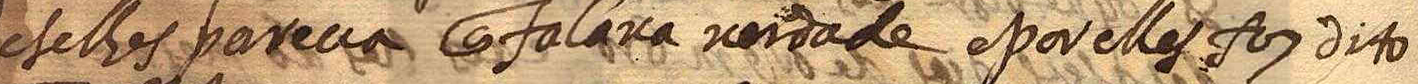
e se lhes parecia q̄ falaua uerdade e por elles foj dito
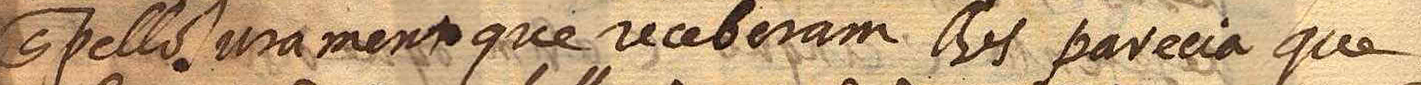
q̄ pello Iuramento que receberam lhes parecia que
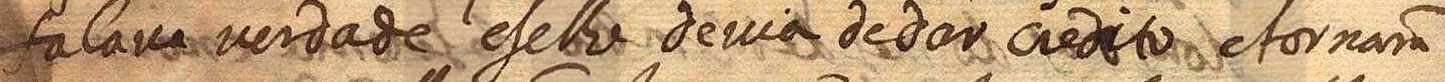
falaua uerdade e se lhe deuia de dar credito e tornarā
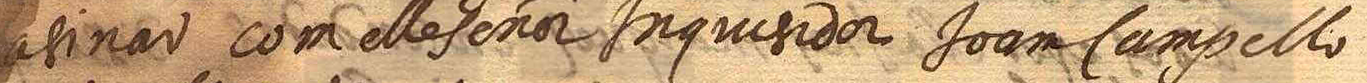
asinar com elle sen̄or Inquisidor Joam Campello
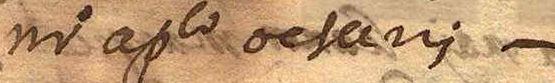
nro apco o escruj
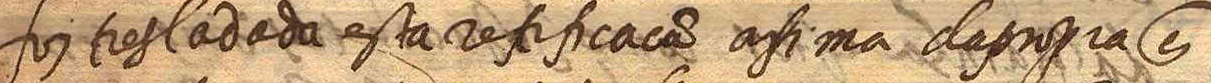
foy tresladada esta retificação asima da propia q̄
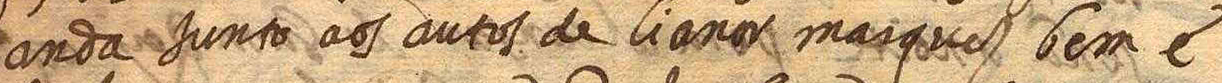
anda junto aos autos de lianor marquez bem e
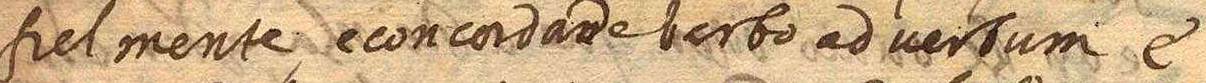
fielmente e concorda de verbo ad uerbum e
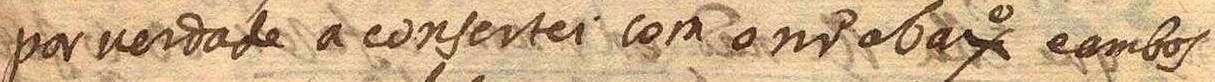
por uerdade a consertei com o nro abaxo e ambos
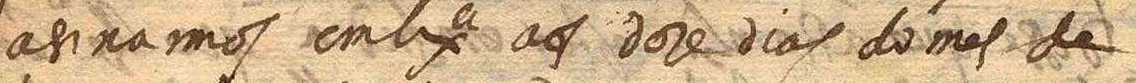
asinamos em lixa aos doze dias do mes de
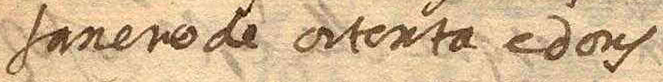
Janero de oitenta e dous
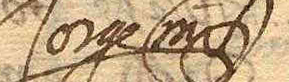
Jorge mīz
